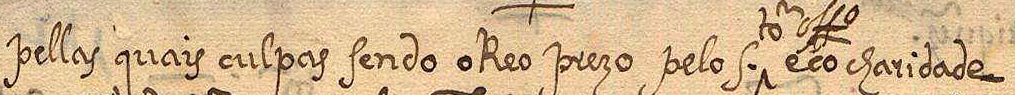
pellas quais culpas sendo o Reo prezo pelo s.to offo e cō charidade
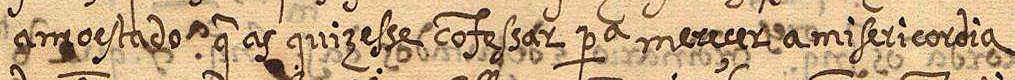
amoestado q̄ as quizesse cōfessar ꝑa mereçer a misericordia
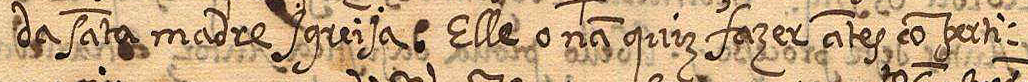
da sāta madre Jgreija. Elle o nā quiz fazer ātes co̅ perti
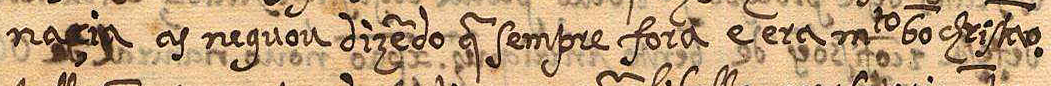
nacia as neguou dizēdo q̄ sempre fora e era mto bo̅ christão
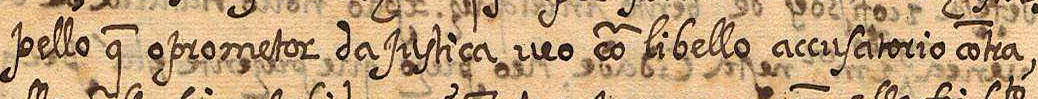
pello q̄ o prometor da Justiça ueo cō libello accusatorio cōtra,
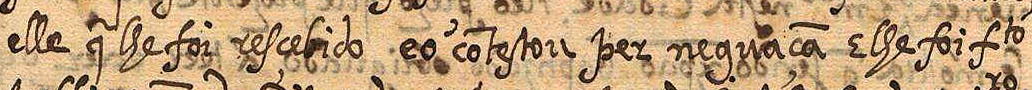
elle q̅ lhe foi recebido e o cōtestou per neguaçā E lhe foi fto
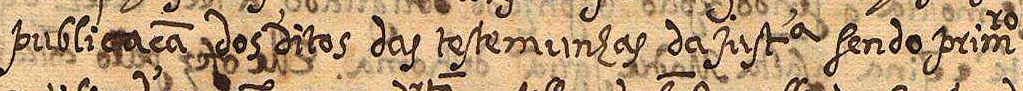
publicaçā dos ditos das testemunhas da Justa sendo primro
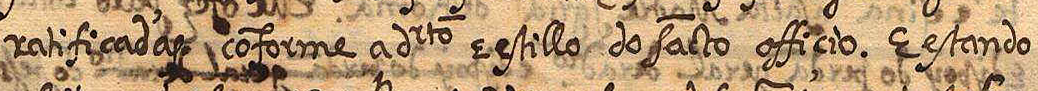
ratificadas cōforme a drto E estillo do Sācto officio. E estando
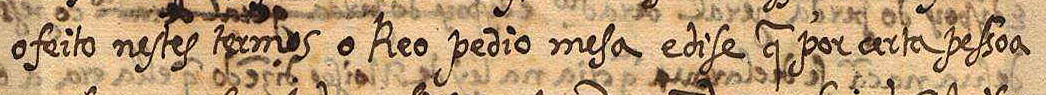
o feito nestes termos o Reo pedio mesa e dise q̄ por certa pessoa
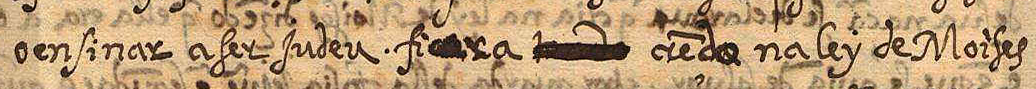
o ensinar a ser Judeu. ficara _ crēdo na ley de Moises
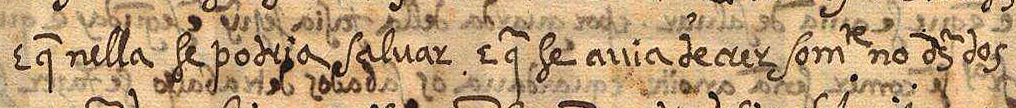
E q̅ nella se podria saluar E q̅ se auia de crer somte no ds̄ dos
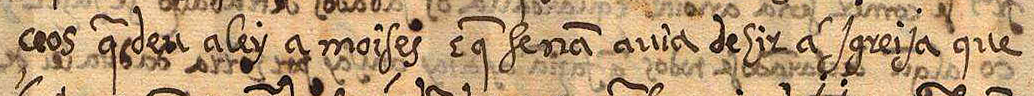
ceos q̄ deu a ley a moises E q̄ se nā auia de hir a JgreiJa que
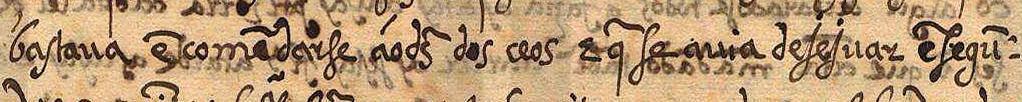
bastaua ēcomēdarse ao ds̄ dos ceos E q̄ se auia de JeJuar e segū
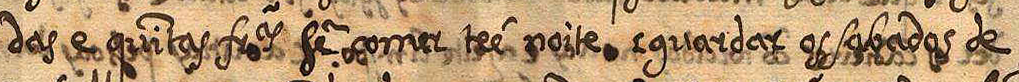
das e quītas fras sē comer tee noite E guardar os sabados de
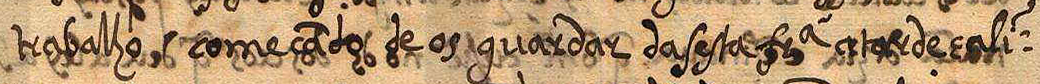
trabalhos começādo de os guardar da sesta fra a tarde e alī
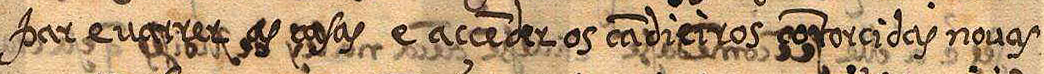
par e uarrer as casas e acçēder os cādieiros cō torçidas nouas
